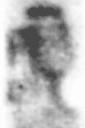彔（綠）
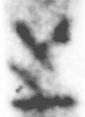之
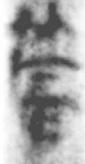○（席）
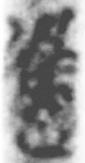○（衡）
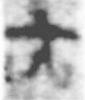戹（軛）
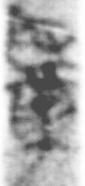○（緅）
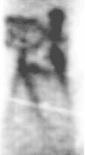敗
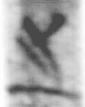之
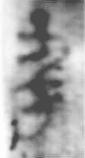韋
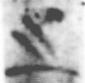之
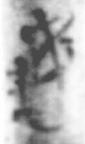○（鞍）
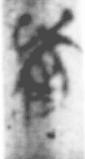紫
